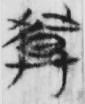登
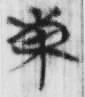東
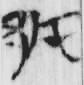○（厇）
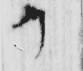人
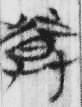登
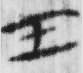壬
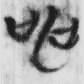申
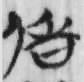俈
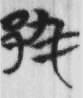○（求）
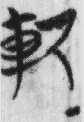○（範）
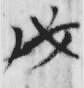戊
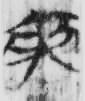寅
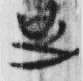疋
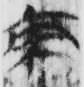朿
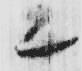乙
